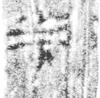而
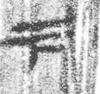下
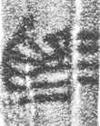爲
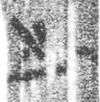之
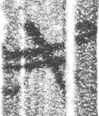女（如）
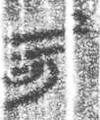可（何）
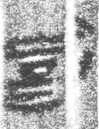合（答）
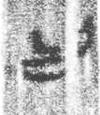曰
